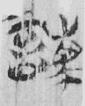諫
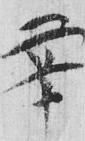不
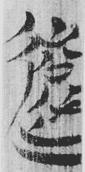遠
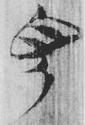視
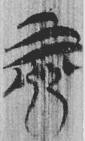而
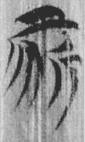所
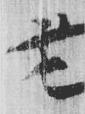弋（代）
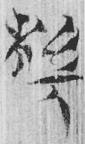機
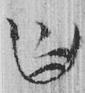曰
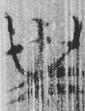皇
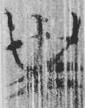皇
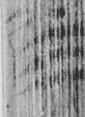隹（惟）
